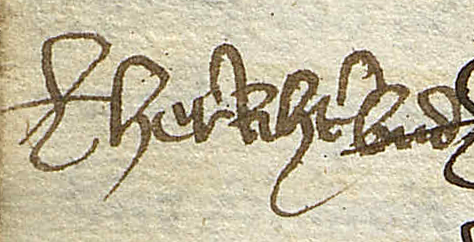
L* her Riht* vnd
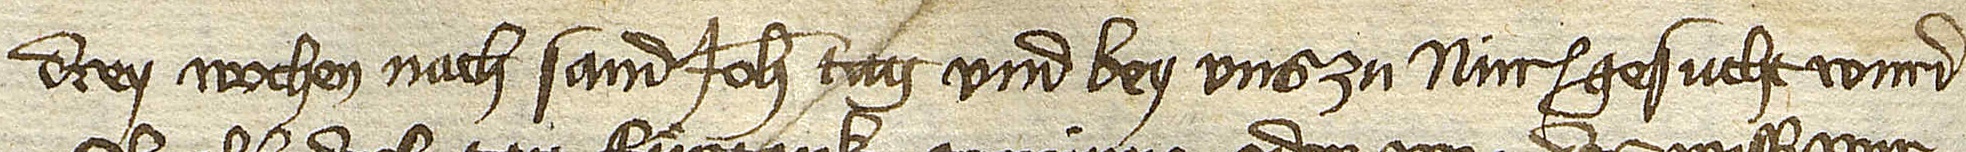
drey wochen nach ſand Ioh* tag vnd bey vns ʒu Nür* geſucht wurd
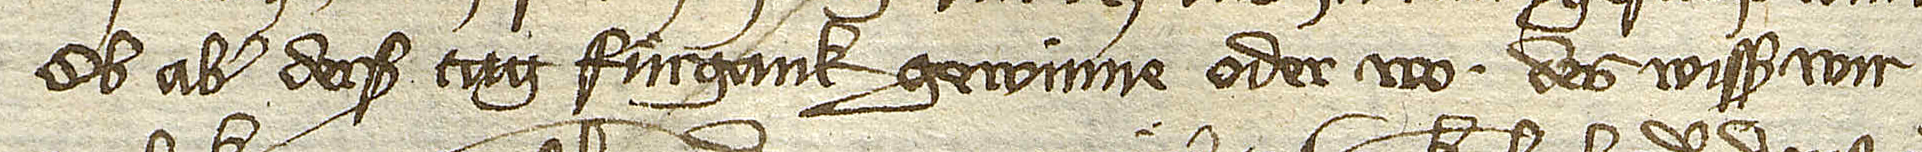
Ob ab* derſ* tag fürgank gewinne oder wo . des wiſſ* wir
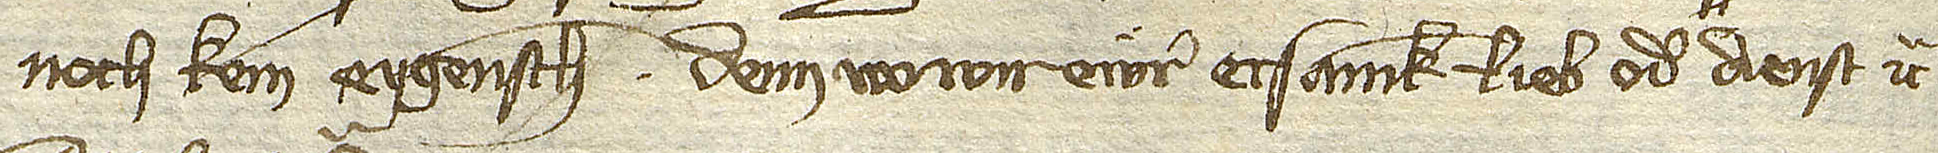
noch kein eygenſch* . Denn wo wir ew*r erſamk* lieb od* dienſt ec*
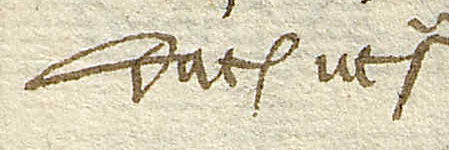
Dat* ut ſ*
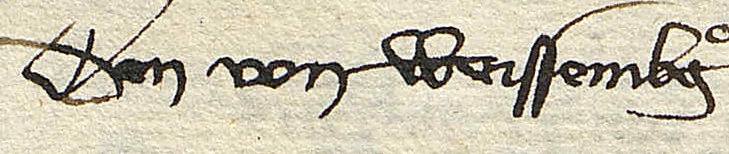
Den von Weiſſemb*g
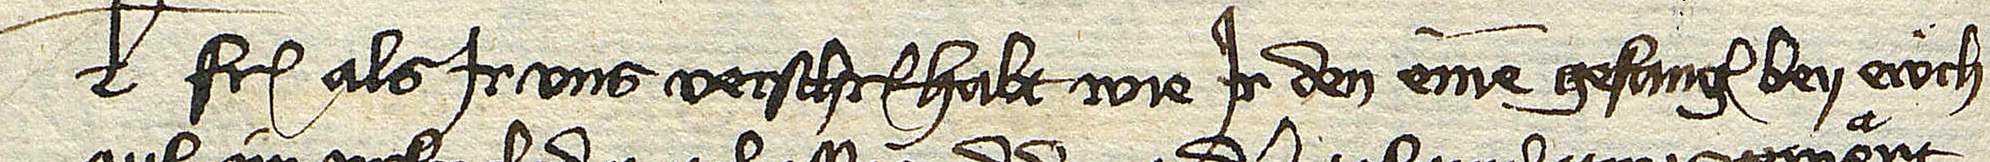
L* fr* als Ir vns verſchr* habt wie Ir den eine* gefang* bey ewch
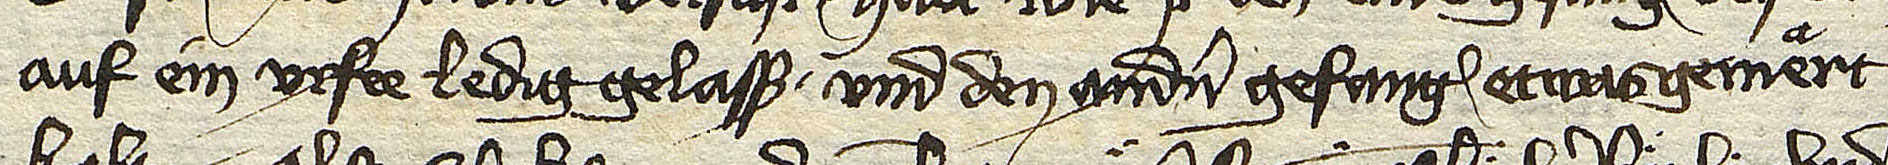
auf ein vrfee ledig gelaſſ* . vnd den and*n gefang* etwas gemërt
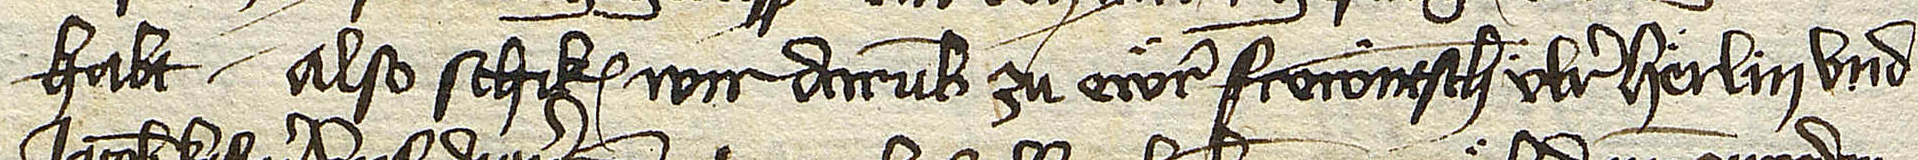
habt / Alſo ſchik* wir daru*b ʒu ew*r frewntſch* v̈lr* hërlin vnd
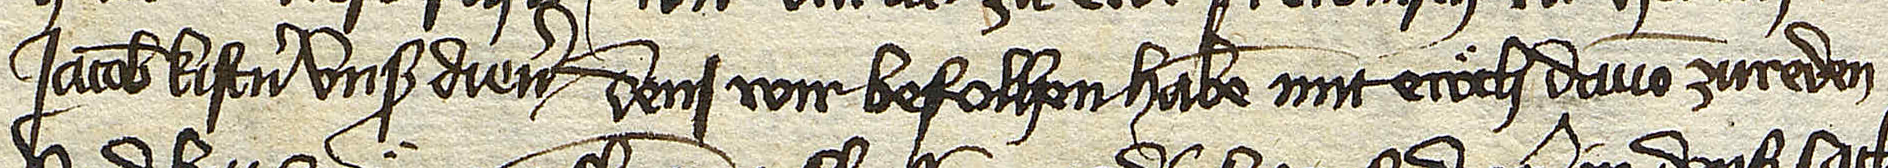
Iacob* kiſtn* Vnſ* dien* / Den wir befolhen habe* mit ewch dauo* ʒureden
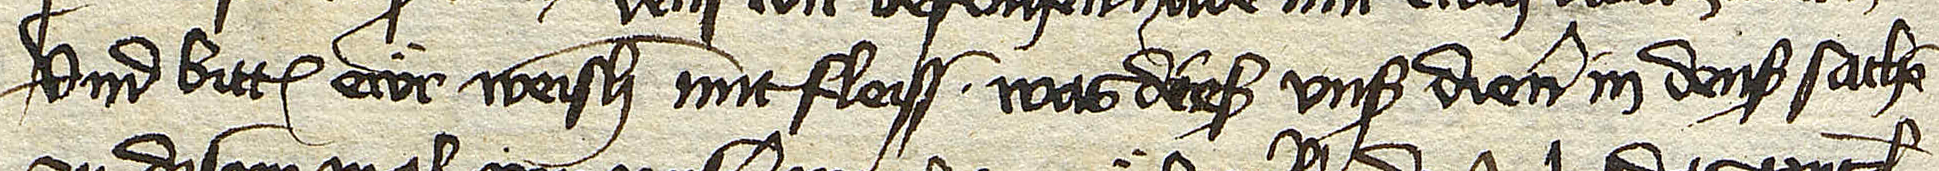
Vnd bitt* ewr weiſh* mit fleiſſ . was derſ* vnſ* dien* in denſ* ſache*
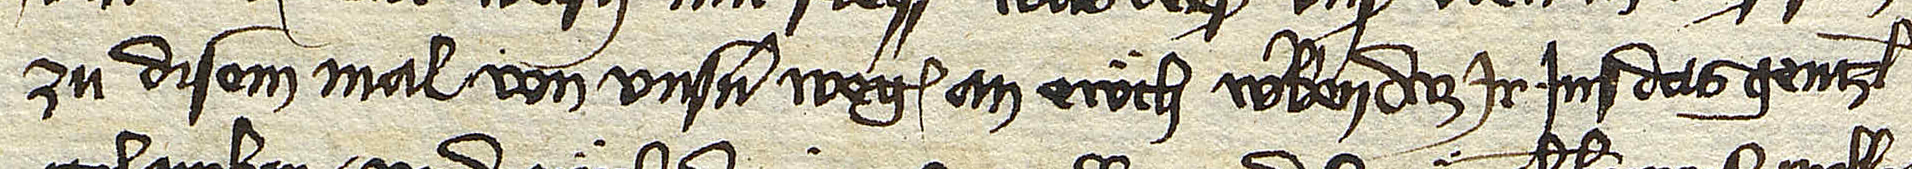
ʒu diſem mal von vnſ*n weg* an ewch w*ben daʒ Ir In das gencʒl*
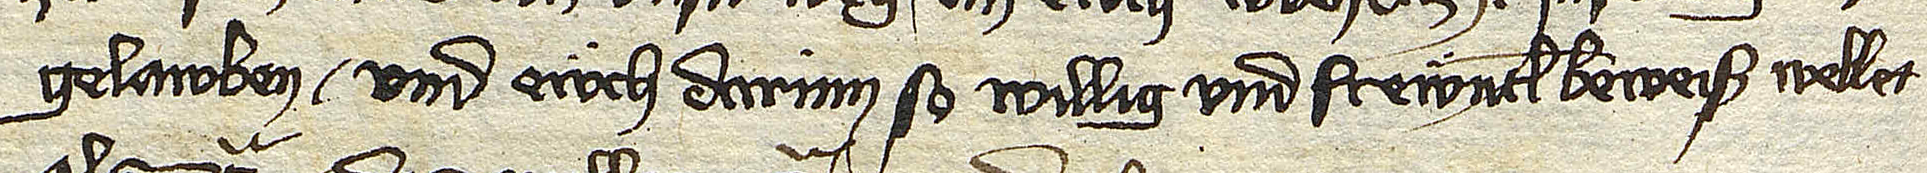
gelawben / vnd ewch darinn ſo willig vnd frewntl* beweiſ* wellet
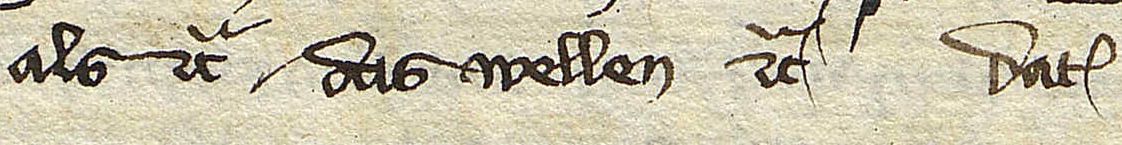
als ec* / das wellen ec* Dat*
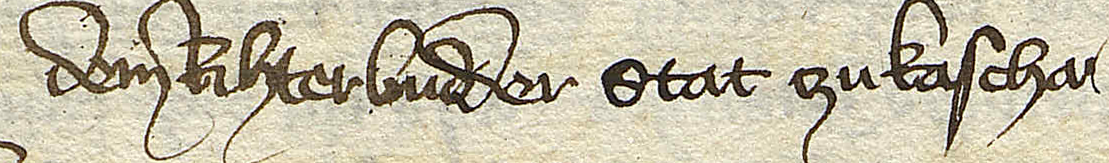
Dem Rihter vnd der Stat cʒu Kaſcha
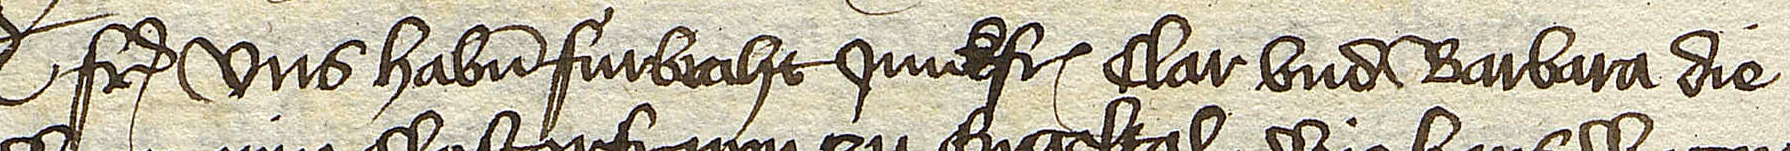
L* fr* Vns hab*n fürbraht Iunkfr* Clar vnd Barbara die
